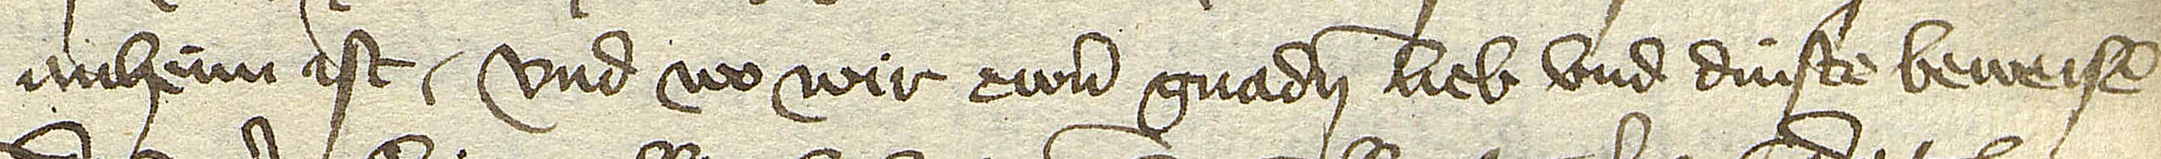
anheim iſt / vnd wo wir ewn* gnadn* lieb vnd dinſte beweiſe*
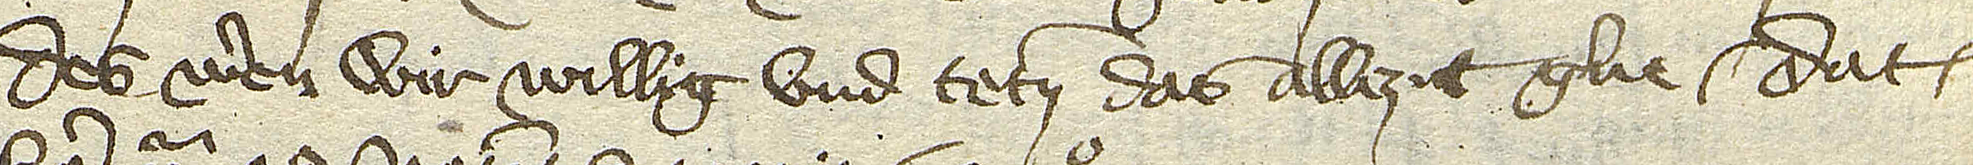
des w*en wir willig vnd tetn* das allcʒeit g*ne / Dat*
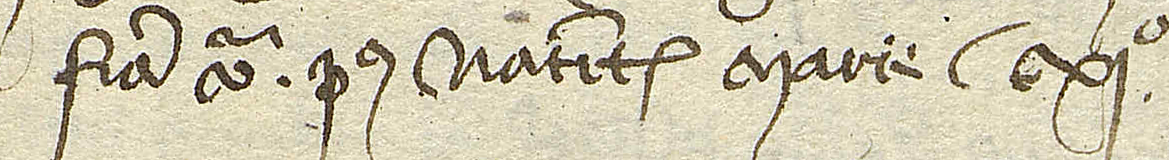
fia* v* . p* Natit* Marie / xi* .
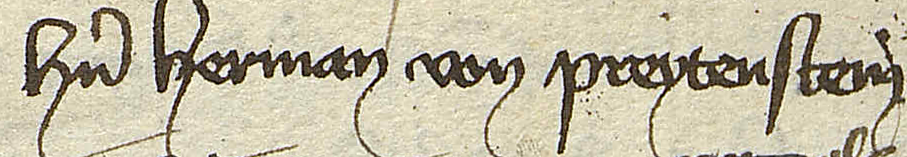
hn* herman von preytenſtein
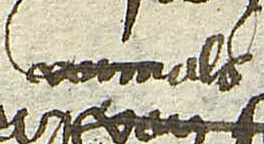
vormals
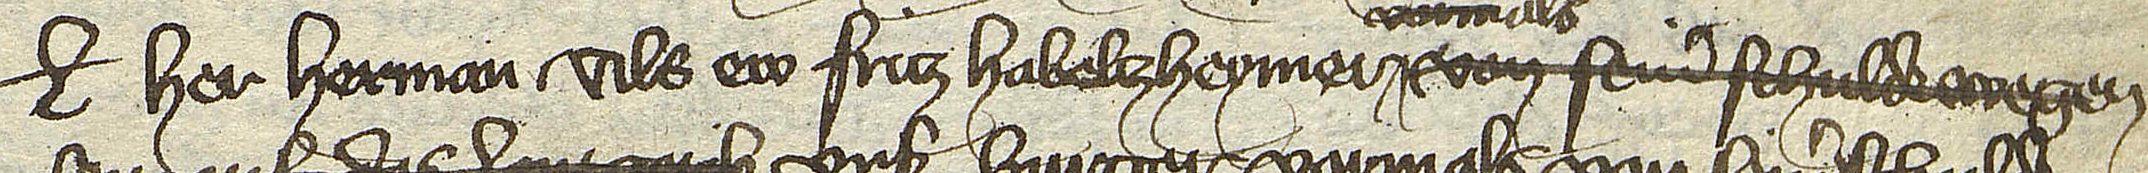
L* her herman / Als ew Fricʒ habelcʒheymer von ſein* ſchulde wegen
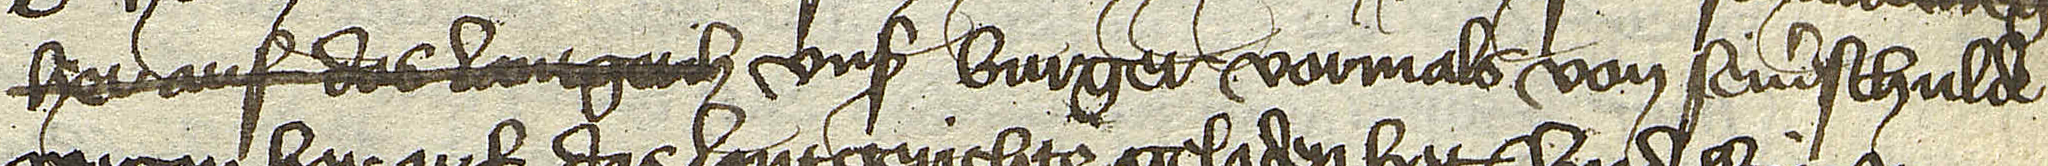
her auf das lantgerih vnſ* burger vormals von ſein* ſchulde
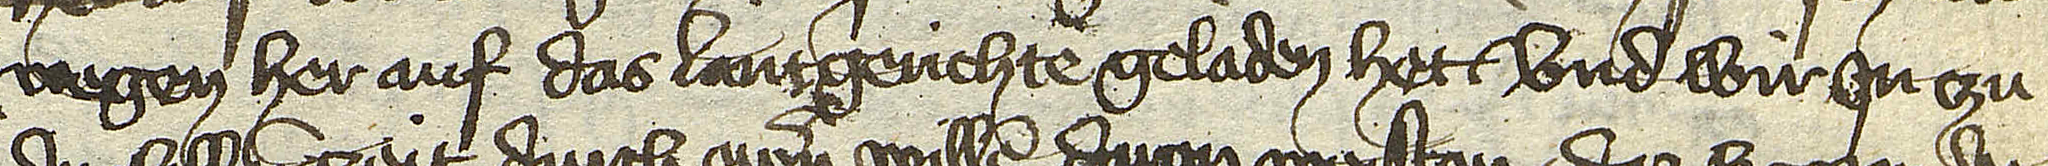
wegen her auf das lantgerichte geladen het / vnd wir In cʒu
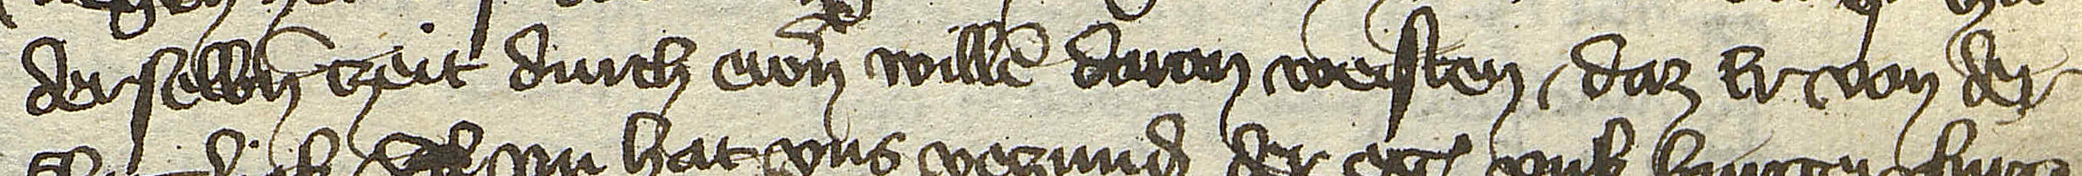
derſelbn* cʒeit durch ew*n wille* daran weiſten / daʒ Er von der
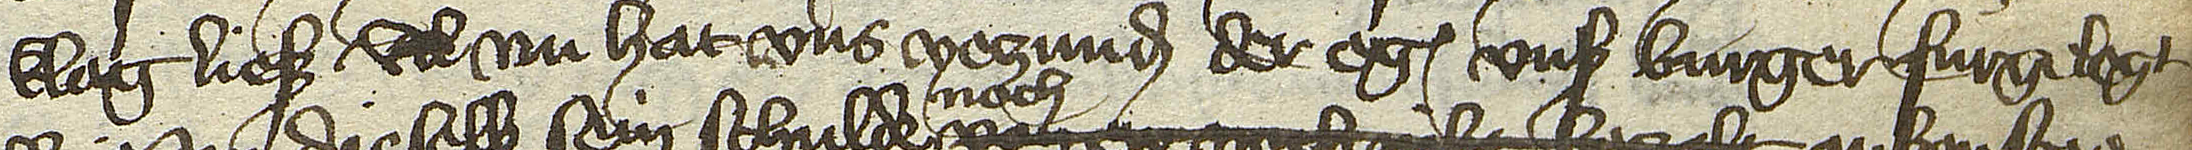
klag lieſʒ / Al Nu hat vns yecʒund der eg* vnſ* burger furgelegt
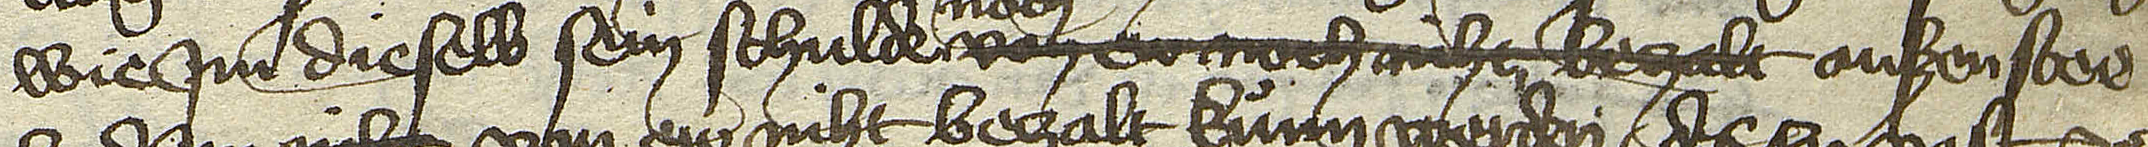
wie Im dieſelb ſein ſchulde von ew noch niht becʒalt auſʒen ſtee
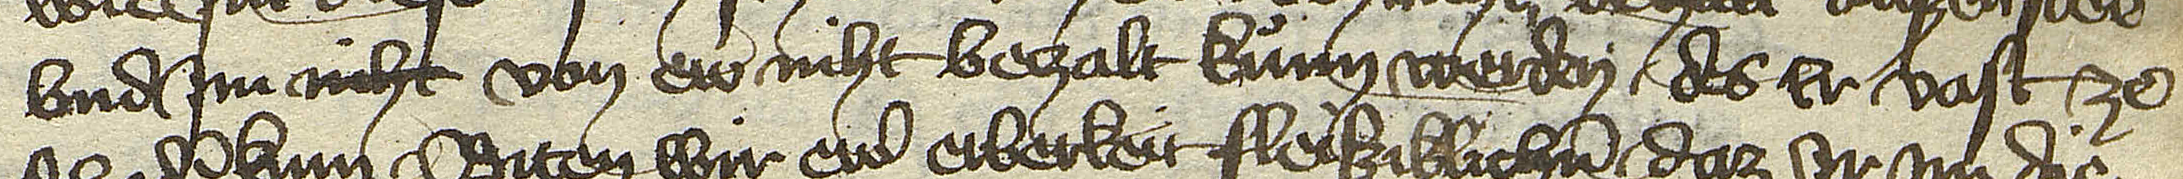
vnd Im niht von ew niht becʒalt künn werden / des Er vaſt cʒe
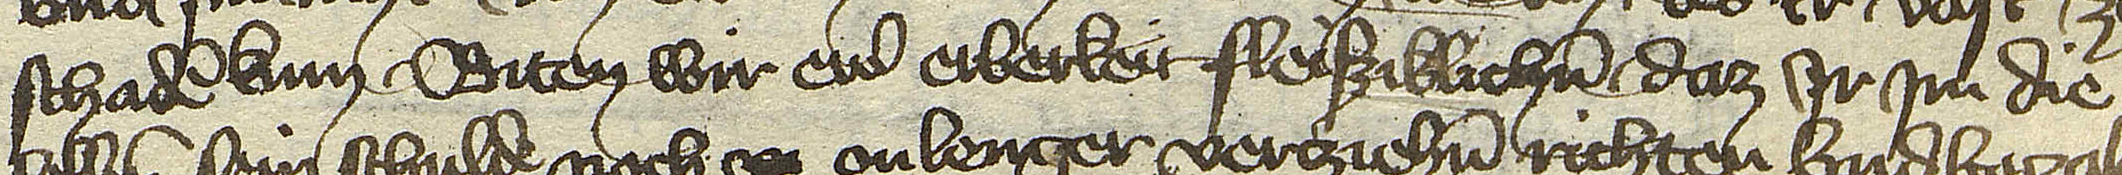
ſchade* kum / Biten wir ew* erberkeit fleiſʒiklichn* / daʒ Ir Im die
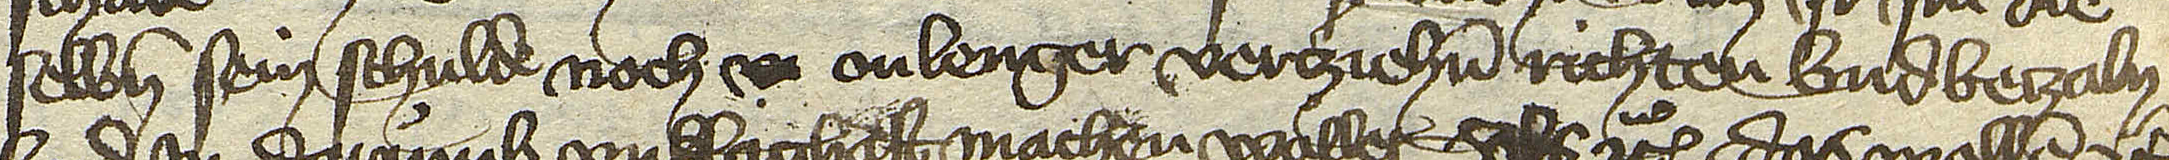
ſelbn* ſein ſchulde noch v onlenger vercʒiehn* richten vnd becʒaln
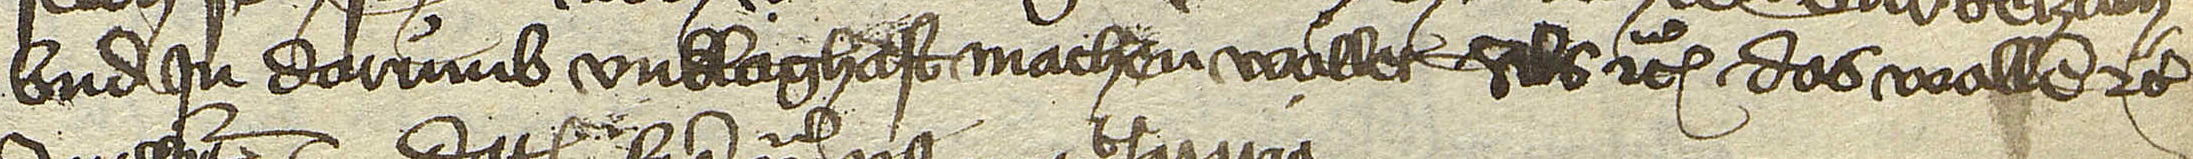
vnd In darümb vnklaghaft machen wöllet / Als ec* / das wolle* ec*
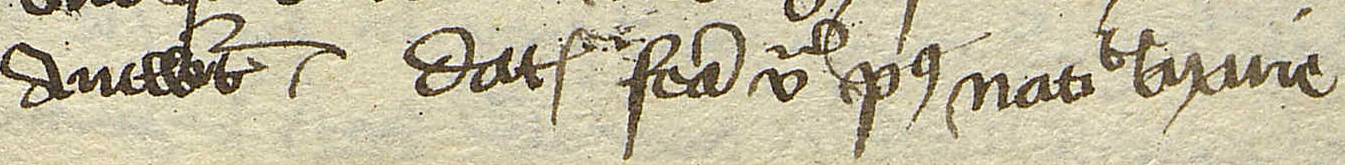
Antwt* / dat* fea* v* p* Nati* Marie
